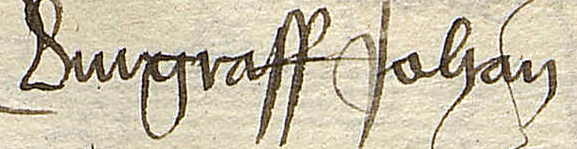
Burgraff Iohan*
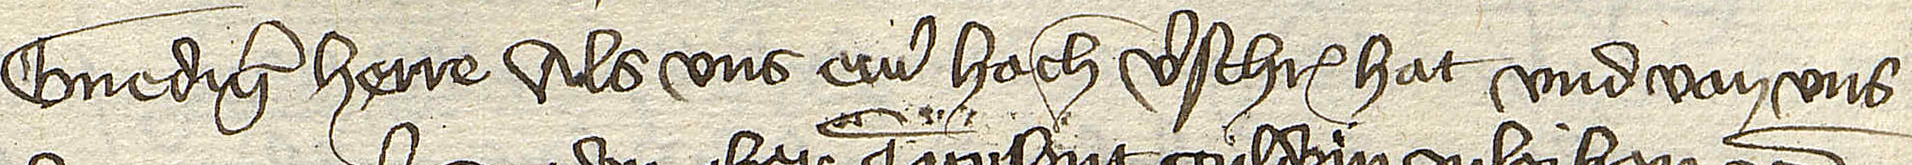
Gnedig* herre Als vns ew* hoch* v*ſchr* hat vnd von vns
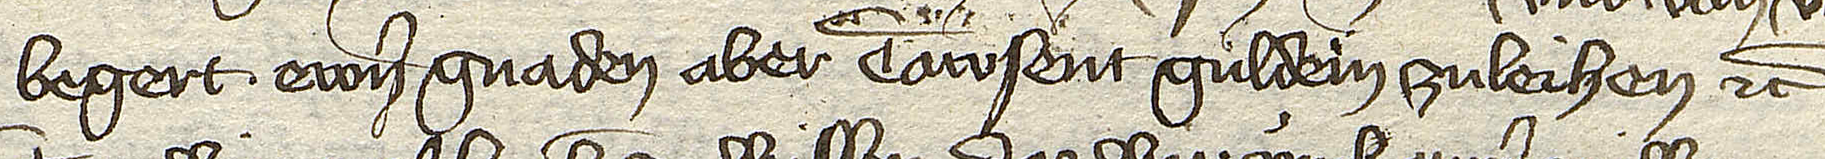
begert . ewn* gnaden aber Tawſent guldein cʒuleihen ec*
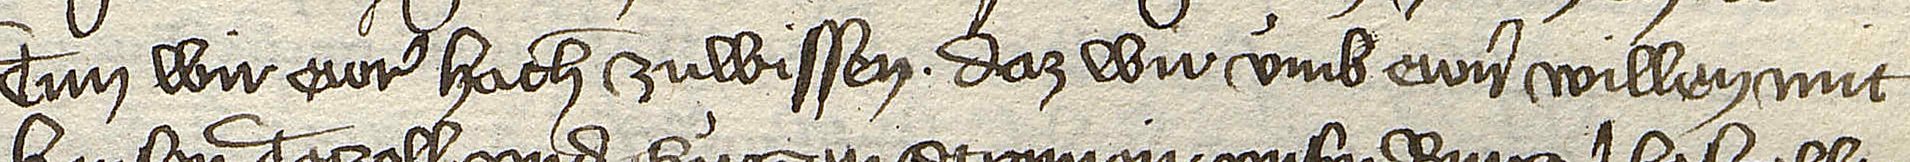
Tun wir ewr* hoch* cʒuwiſſen . daʒ wir v̈mb ewn* willen mit
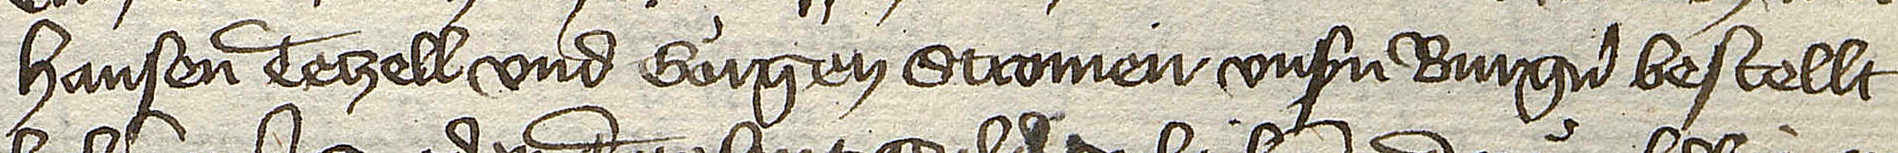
hanſen Tecʒell vnd Görgen Stromeir vnſ*n Burgn* beſtellt
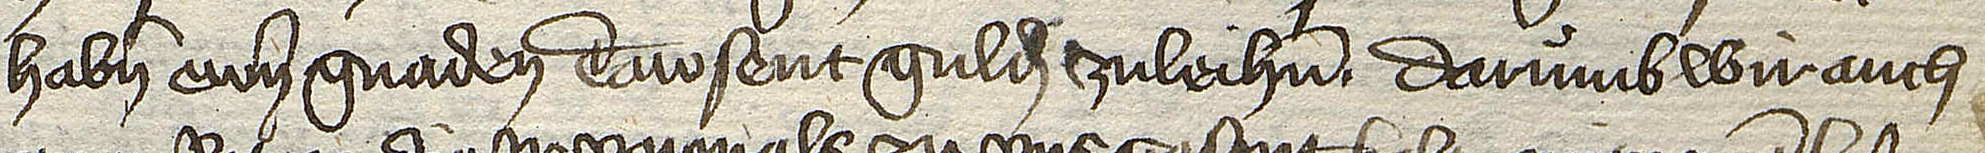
habn* ewn* gnaden Tawſent guld* cʒuleihn* . Darümb wir auch
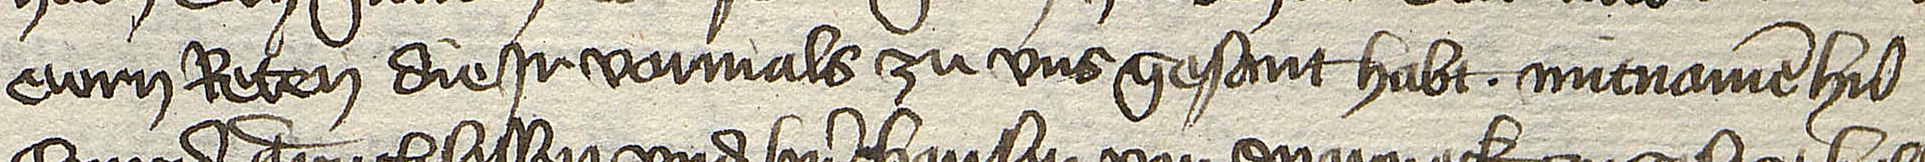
ewrn Reten die Ir vormals ʒu vns geſant habt . mitname* hn*
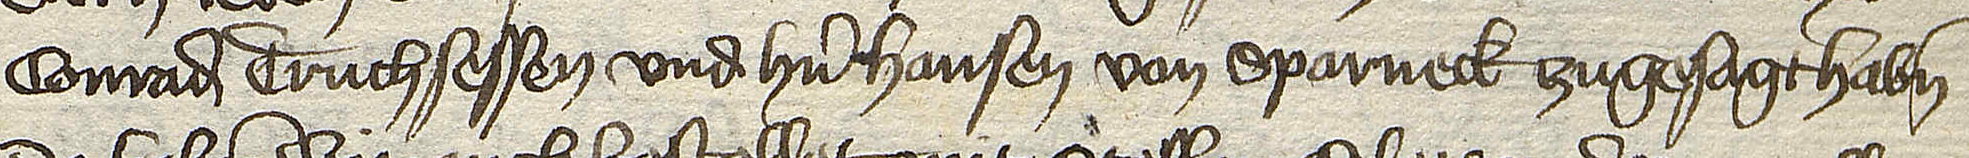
Conrad Truchſeſſen vnd hn* hanſen von Sparneck cʒugeſagt habn*
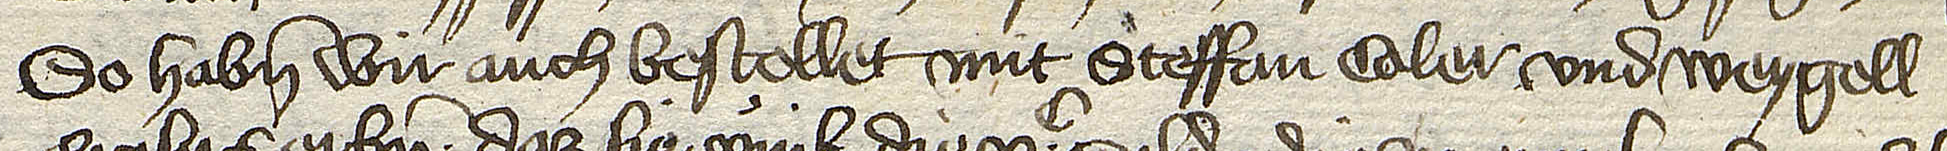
So habn* wir auch beſtellet mit Steffan Coler vnd weygell
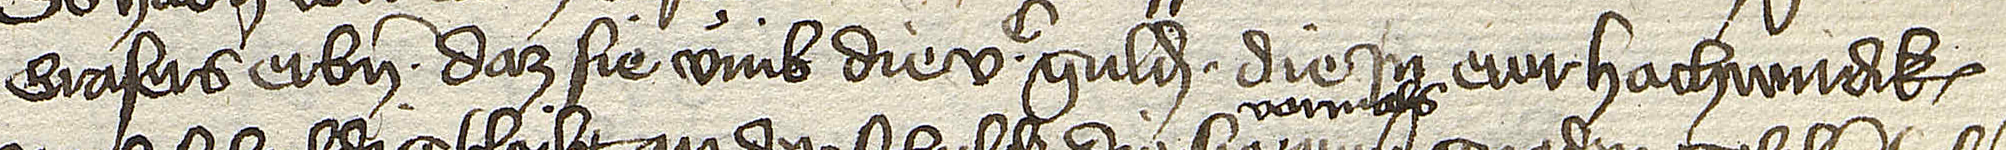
Graſers erbn* . daʒ ſie v̈mb die v* . guld* . die In ewr hochwirdik*
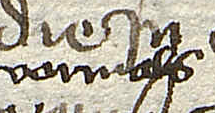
vormals
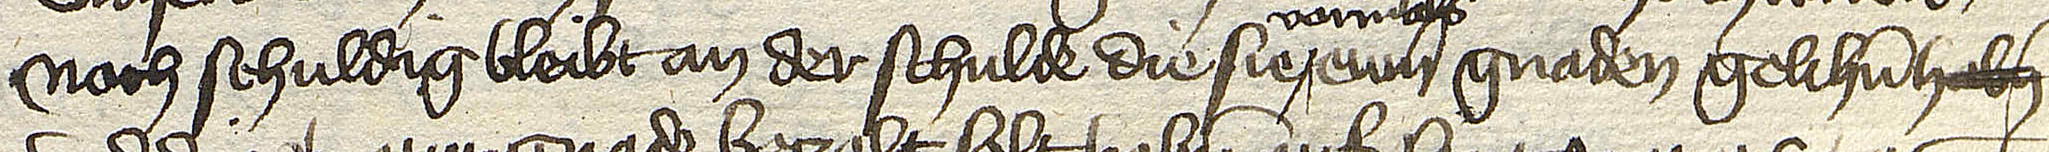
noch ſchuldig bleibt an der ſchulde die ſie ewn* gnaden gelihn* habn*
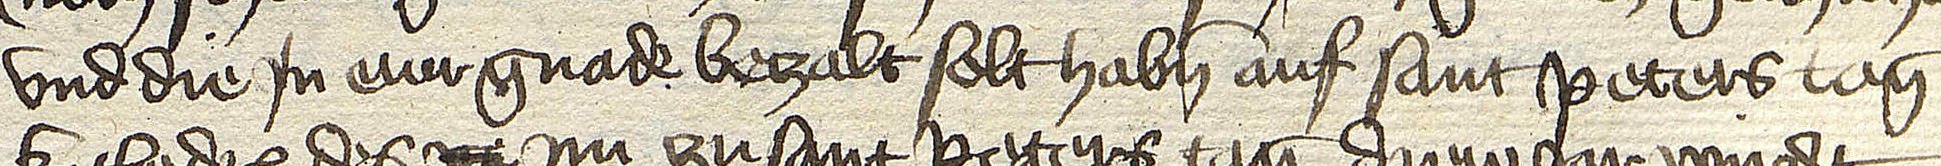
vnd die In ewr gnade becʒalt ſolt habn* auf ſant Peters tag
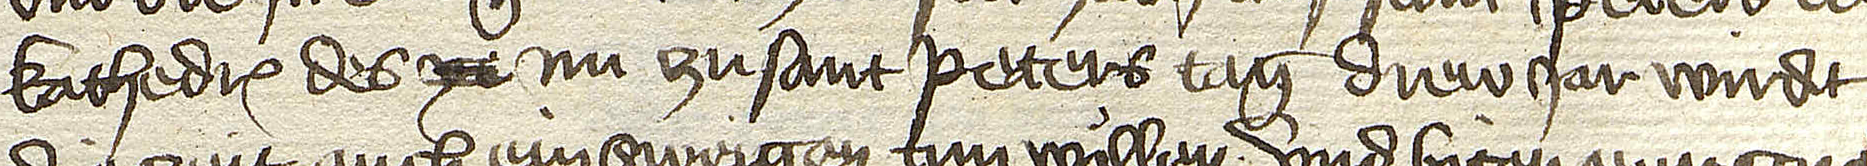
kathedr* des ye nu cʒu ſant Peters tag drew Iar wirdt
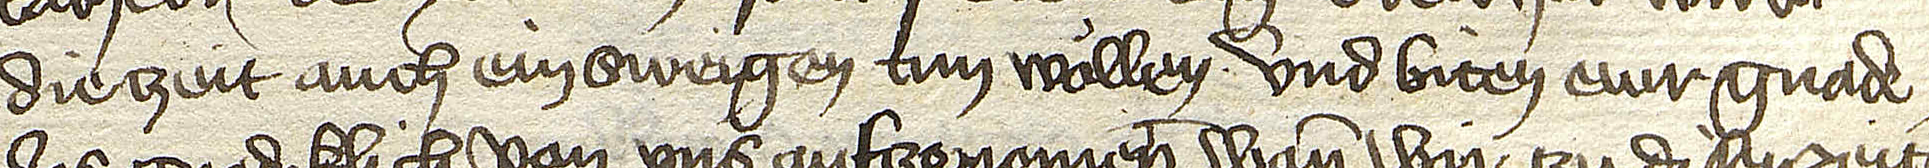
die cʒeit auch ein Sweigen tun wöllen . vnd biten ewr gnade
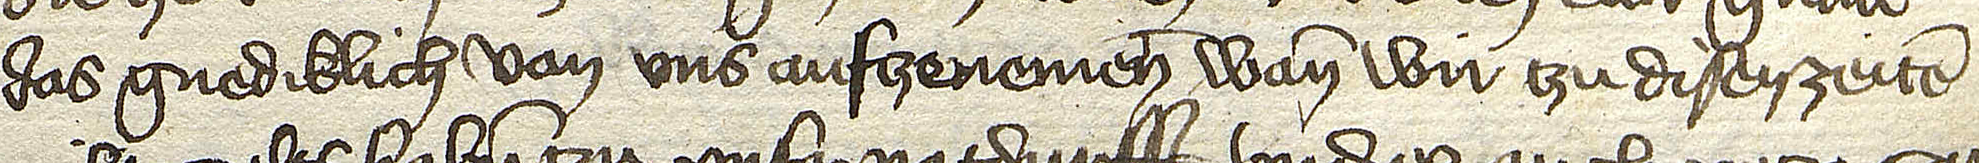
das gnediklich von vns aufcʒenemen* wan* wir cʒu diſen ʒeite*
